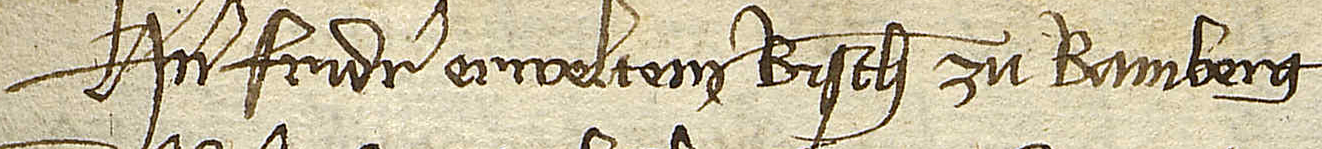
H*n fridr* erweltem Biſch* ʒu Bamberg
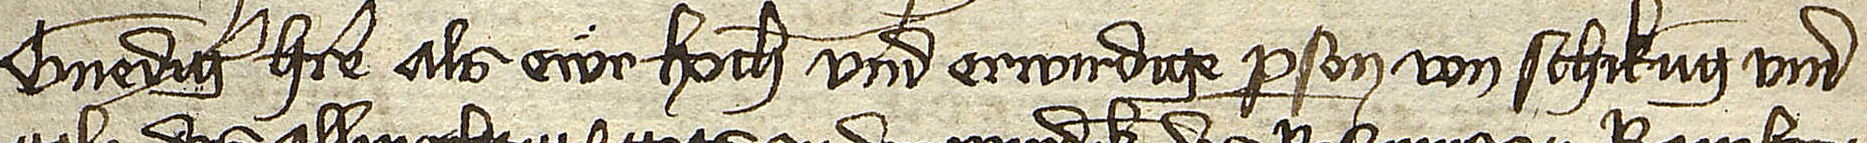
Gnedig* h*re als ewr hoch* vnd erwirdige p*ſon von ſchikug* vnd
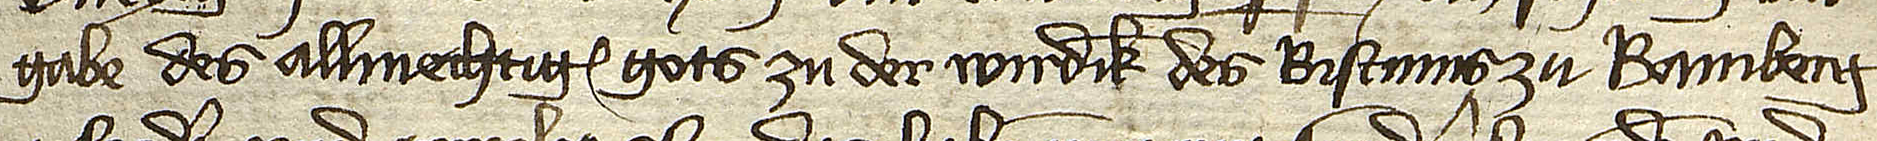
gabe des allmechtig* gots ʒu der wirdik* des Biſtums ʒu Bamberg
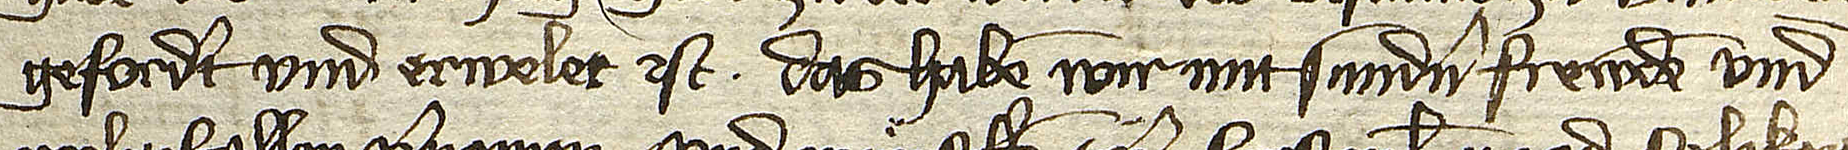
geford*t vnd erwelet iſt . das habe* wir mit ſund*n frewde* vnd
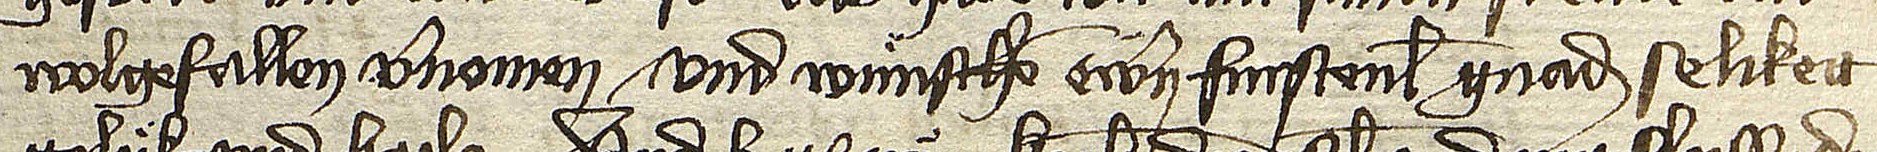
wolfgefallen v*nomen / vnd wünſche* ew*n furſtenl* gnad* ſelikeit
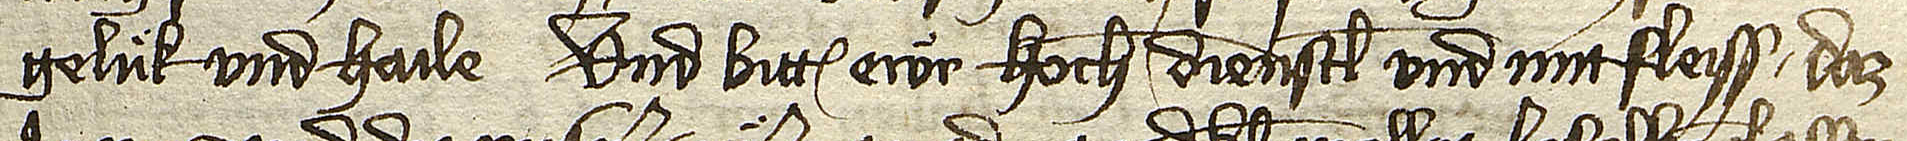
gelük vnd haile / Vnd bitt* ewr hoch* dienſtl* vnd mit fleiſſ / daʒ
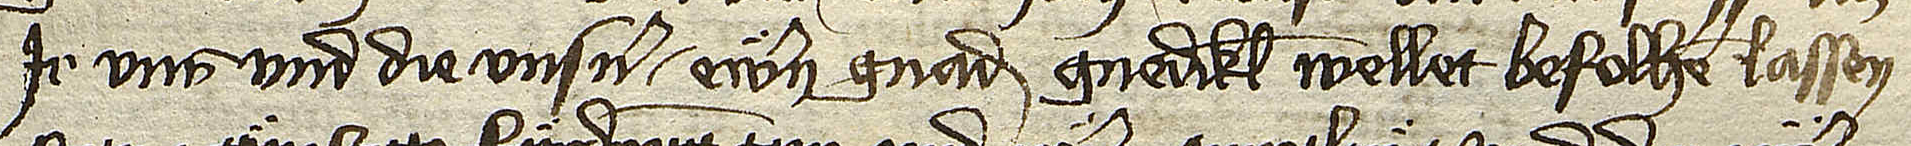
Ir vns vnd die vnſ*n / ew*n gnad* gnedikl* wellet befolhe* laſſen
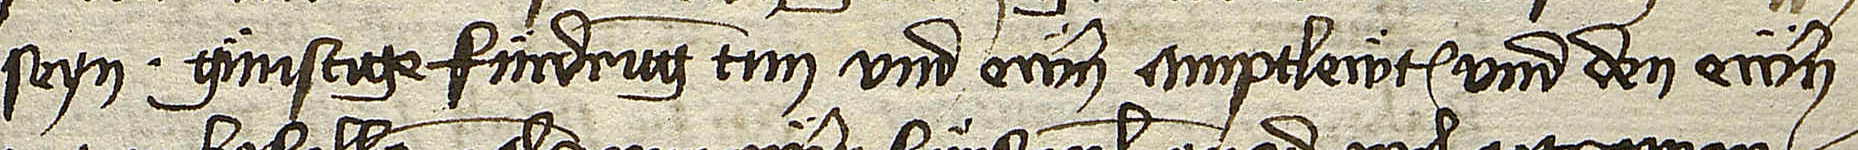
ſeyn . günſtige fürdrug* tun vnd ew*n amptlewt* vnd den ew*n
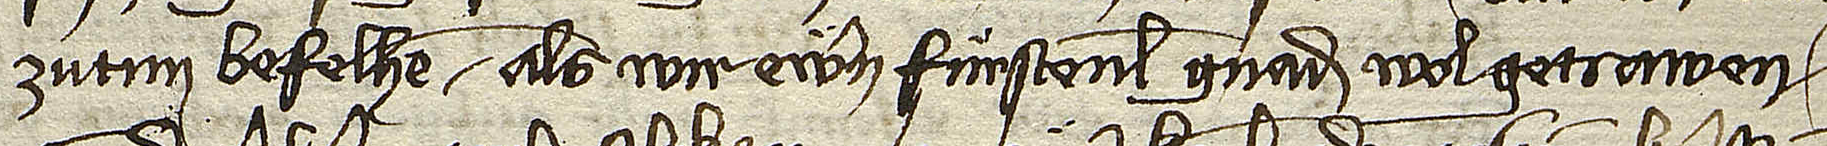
ʒutun befelhe* / als wir ew*n fürſtenl* gnad* wol getrawen
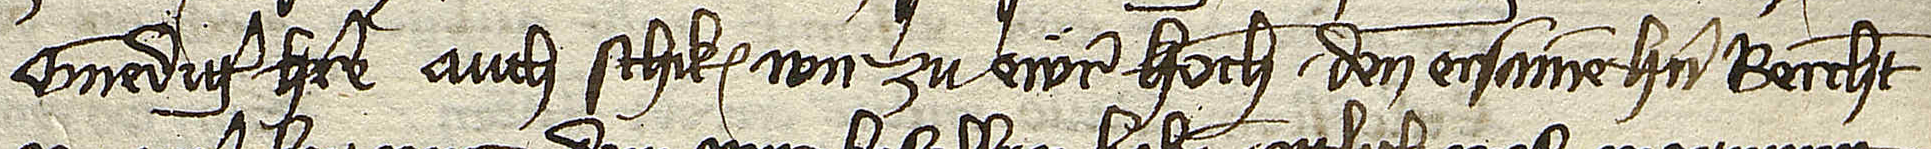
Gnedig* hr*e auch ſchik* wir ʒu ewr hoch / den erſame* hn* Bercht*
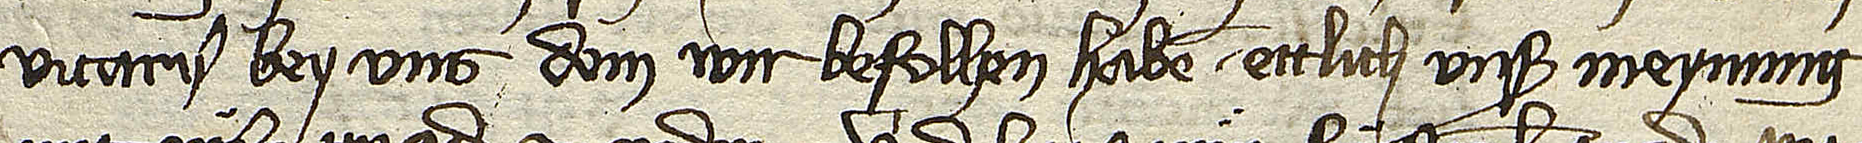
vicary* bey vns dem wir befolhen habe* / ettlich vnſ* meynung
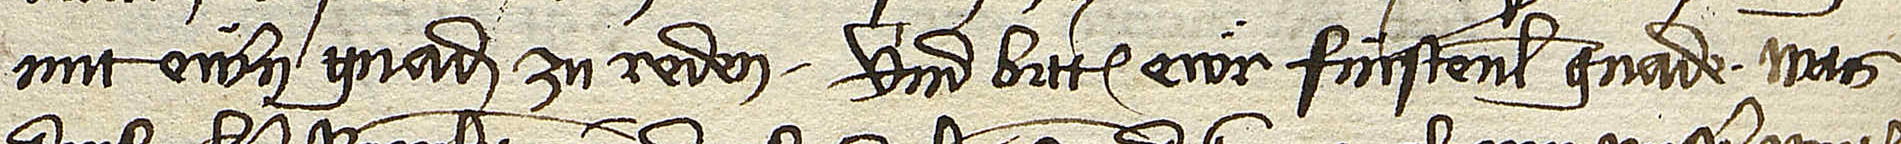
mit ew*n gnad* ʒu reden / Vnd bitt* ewr fürſtenl* gnade . was
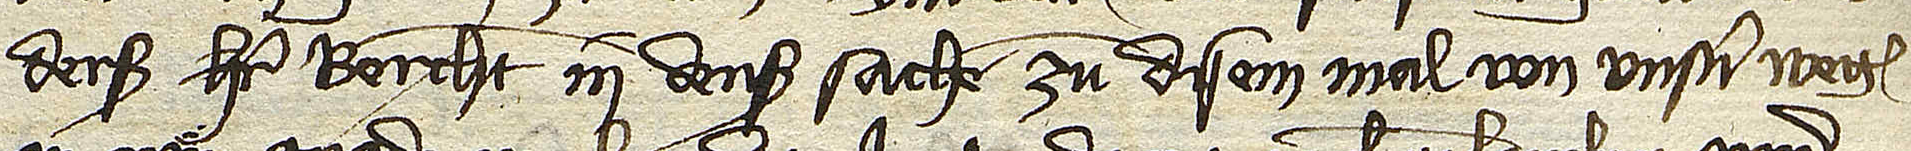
derſ* hr* Bercht* in denſ* ſache* ʒu diſem mal von vnſ*n weg*
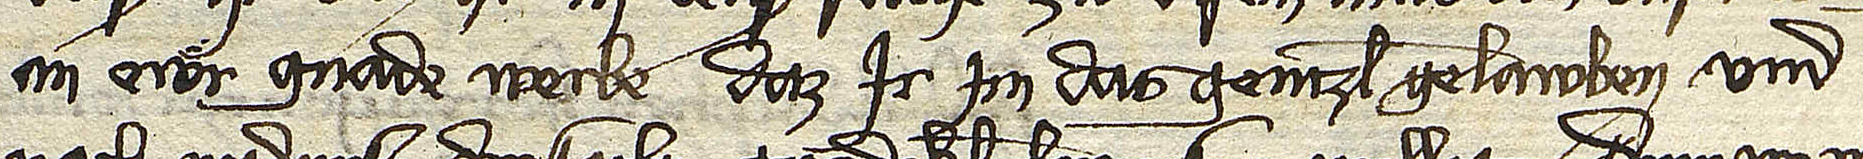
an ewr gnade werbe daʒ Ir Im das gencʒl* gelawben vnd
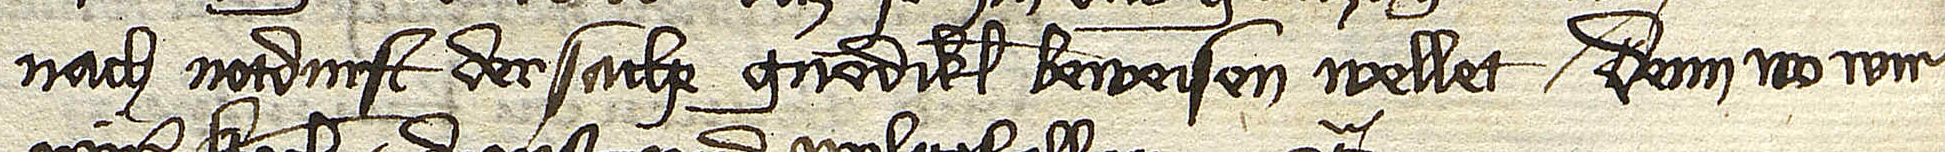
nach notdurft der ſache gnedikl* beweiſen wellet / Denn wo wir
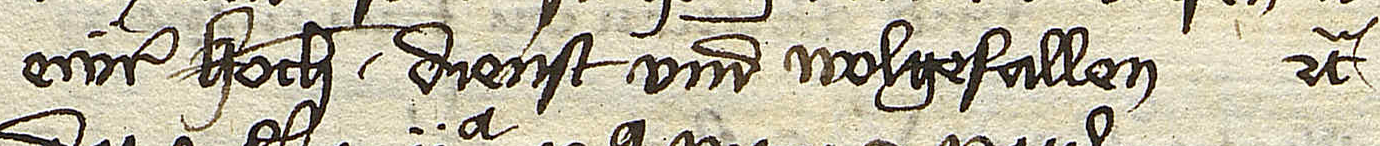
ewr hoch* / dienſt vnd wolgefallen ec*
